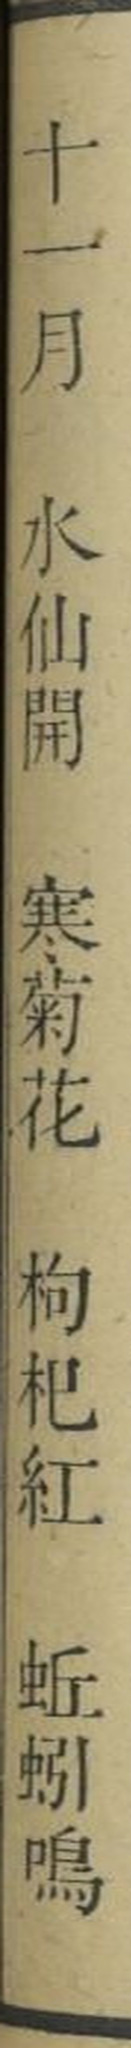十一月水仙開寒菊花枸杞紅蚯蚓鳴
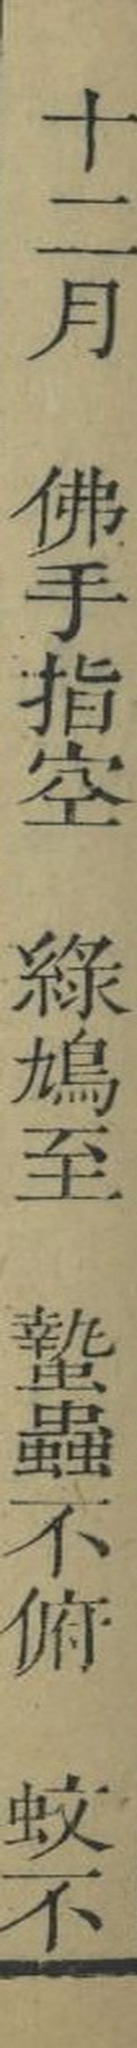十二月仏手指空緑鳩至蟄虫不俯蚊不
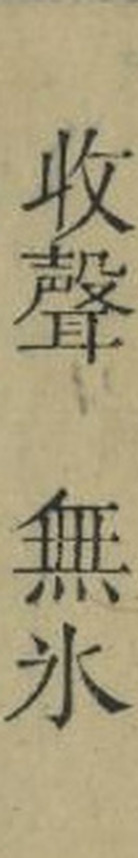収声無氷
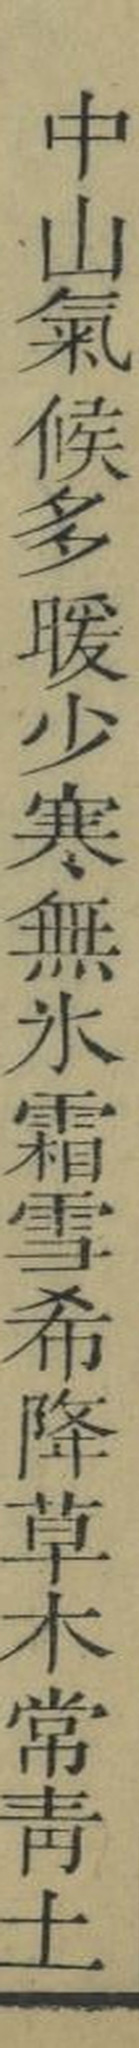中山気候多暖少寒無氷霜雪希降草木常青土
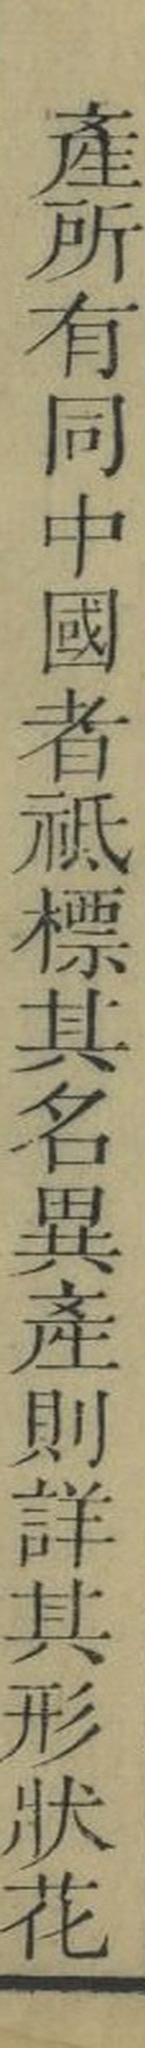産所有同中国者祇標其名異産則詳其形状花
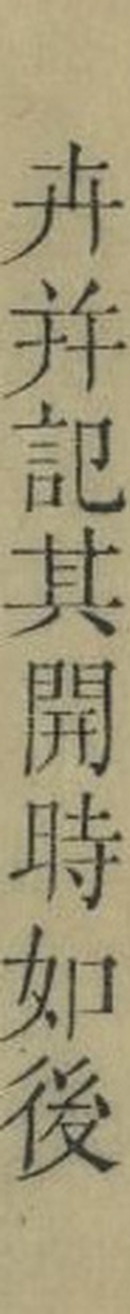卉幷記其開時如後
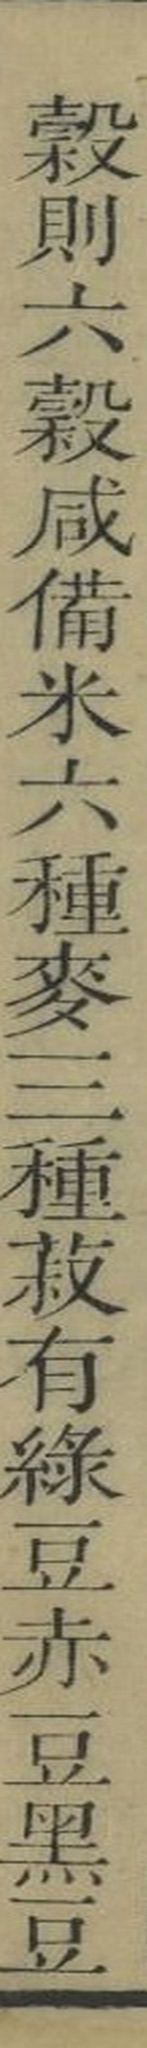穀則六穀咸備米六種麦三種菽有緑豆赤豆黒豆
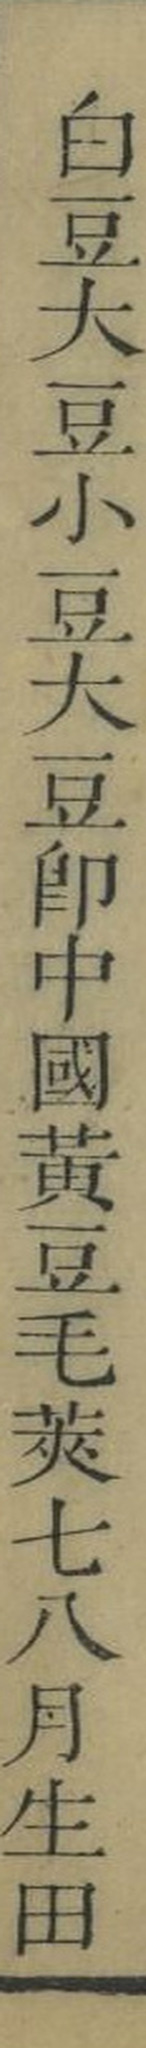白豆大豆小豆大豆即中国黄豆毛莢七八月生田

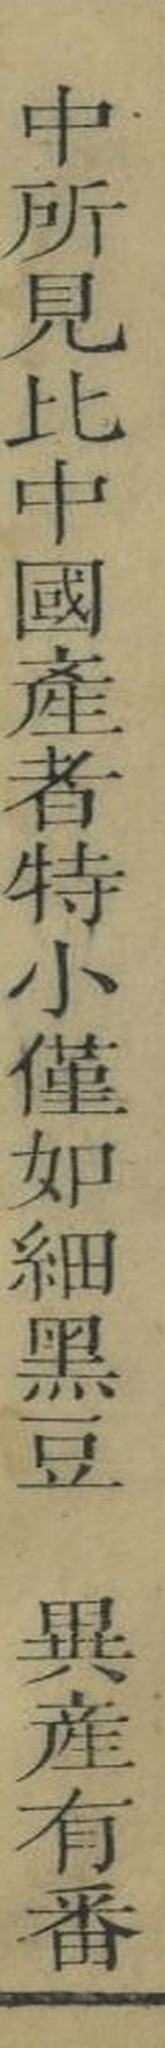中所見比中国産者特小僅如細黒豆異産有番
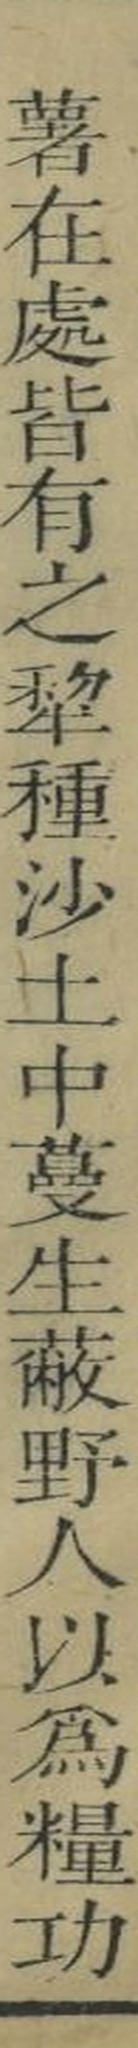薯在処皆有之犂種沙土中蔓生蔽野人以為糧功
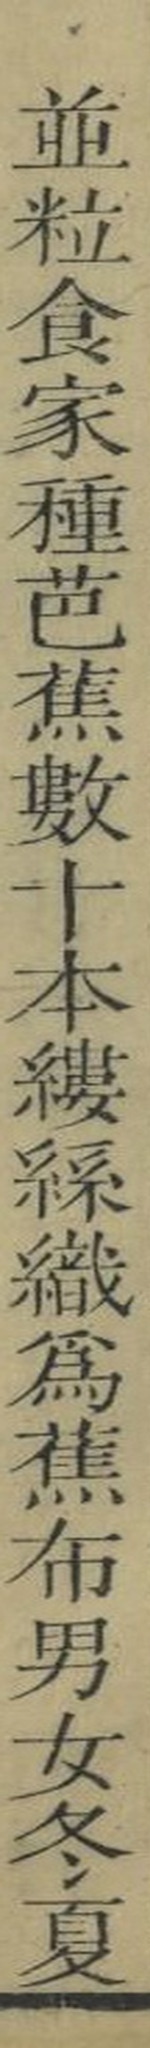並粒食家種芭蕉数十本縷糸織為蕉布男女冬夏
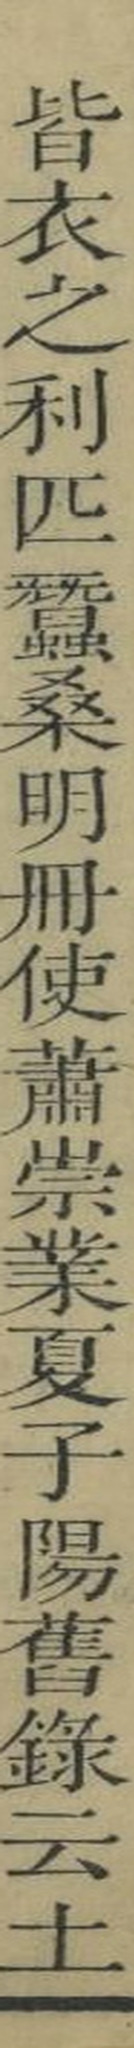皆衣之利匹蚕桑明冊使蕭崇業夏子陽旧録云土
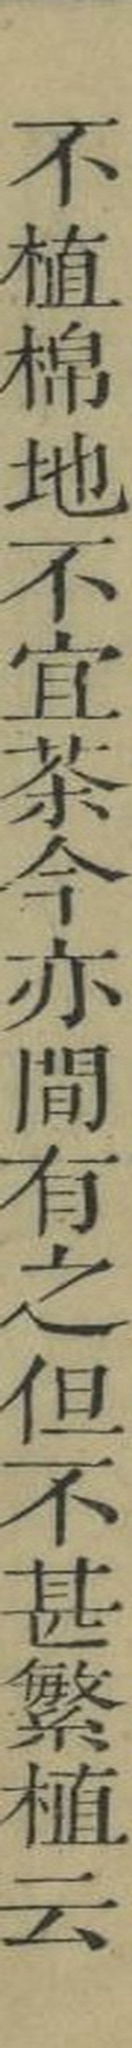不植棉地不宜茶今亦間有之但不甚繁植云
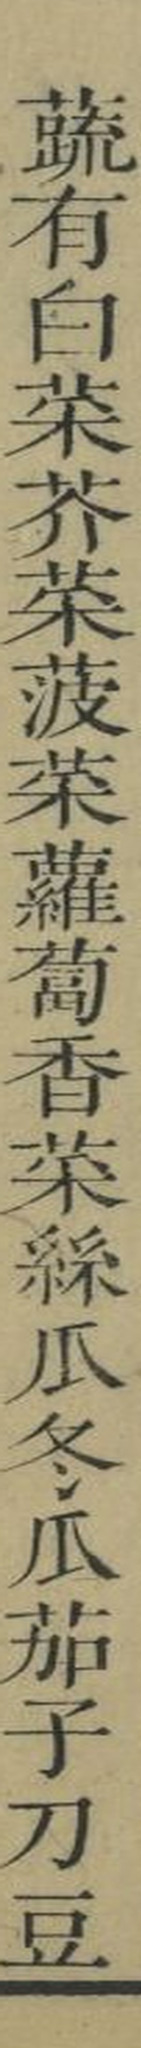蔬有白菜芥菜菠菜蘿蔔香菜糸瓜冬瓜茄子刀豆
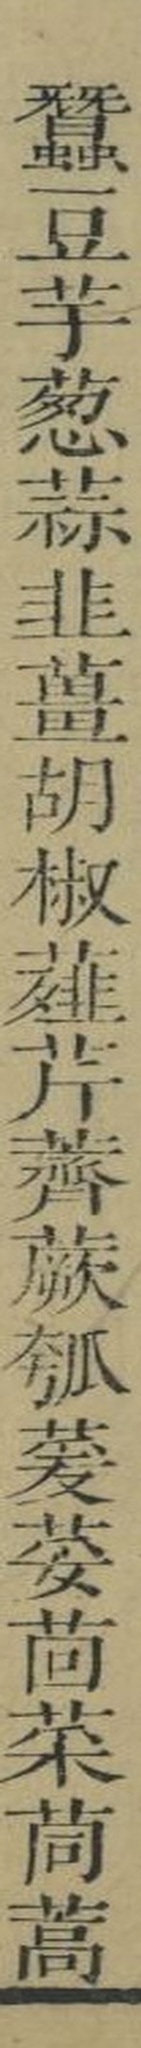蚕豆芋葱蒜韭薑胡椒薤芹薺蕨瓠萲荽茴菜茼蒿
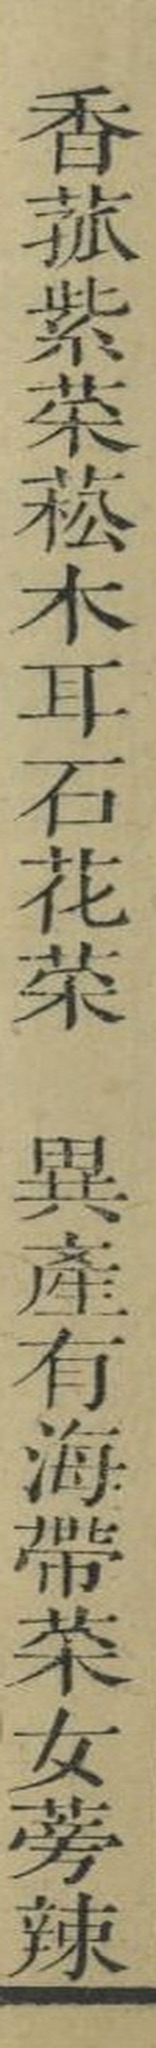香菰紫菜菘木耳石花菜異産有海帯菜女蒡辣
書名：中山伝信録 巻六
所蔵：University of the Ryukyus Library
